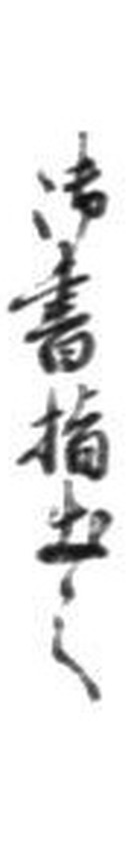御書指出之
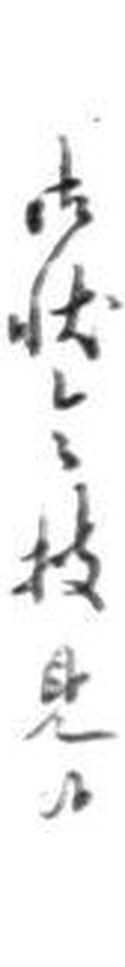御状令披見候
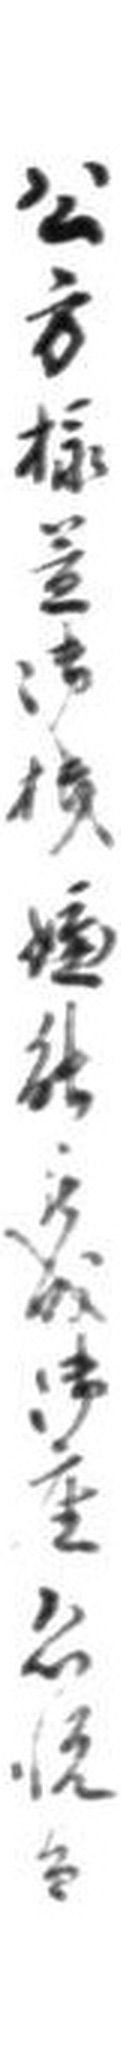公方様益御機嫌能被成御座恐悦旨

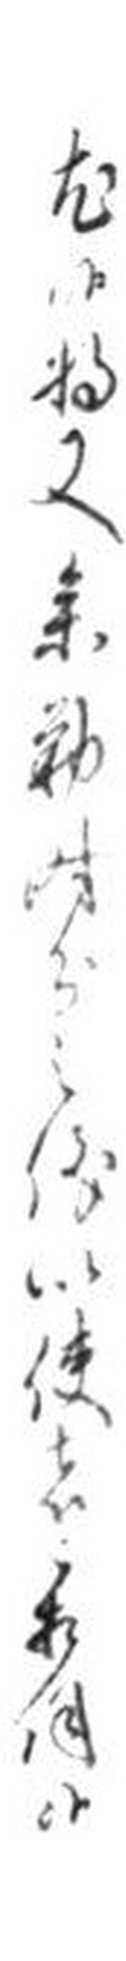尤候将又参勤時分之儀以使者相伺候
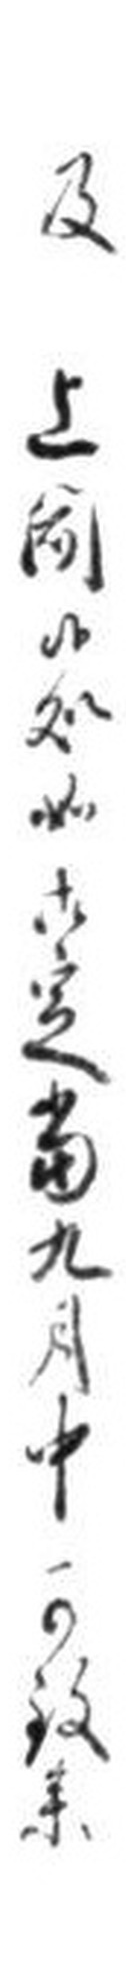及上聞候処御定当九月中可致参
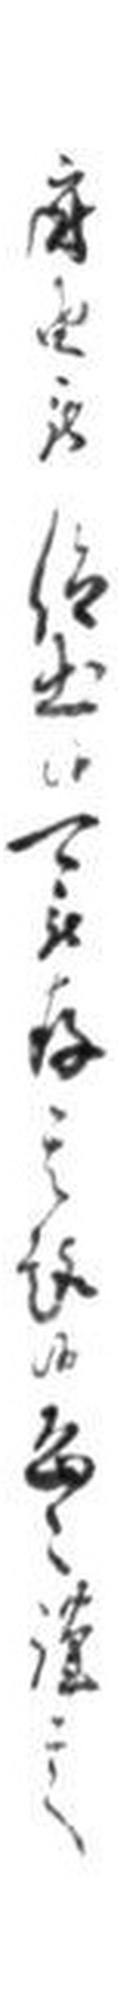府由被仰出候可被存其趣候恐々謹言
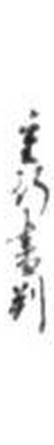重行書判
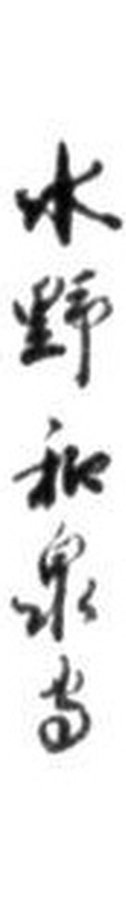水野和泉守
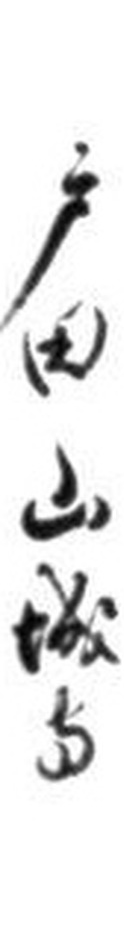戸田山城守
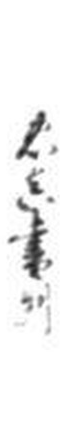忠真書判
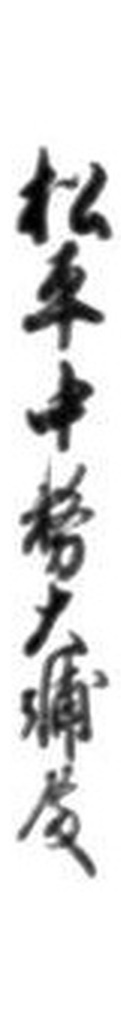松平中務大輔殿
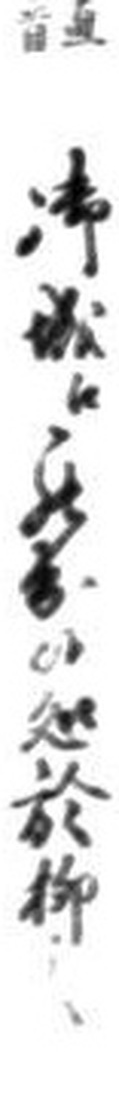看御城江罷出候処於柳之
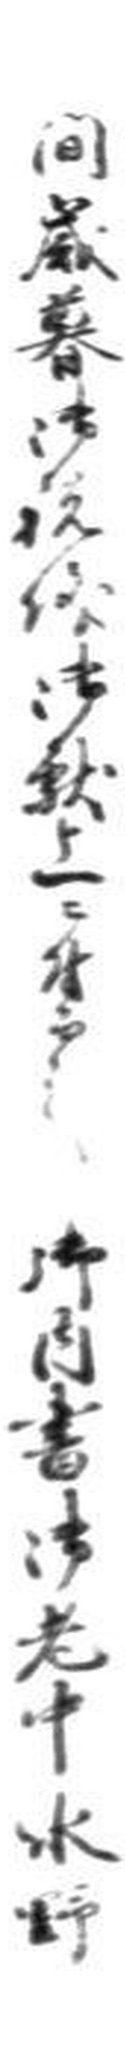間歳暮御祝儀御献上ニ付而之御内書御老中水野
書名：家譜 三十六 宗昌公 従享保八年到同九年
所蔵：福井県文書館 Fukui Prefectural Archives
